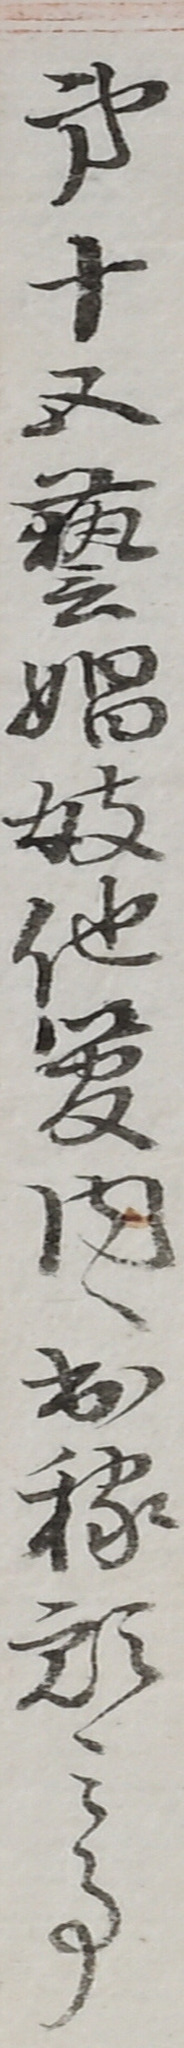第十五芸娼妓他管内へ出稼願之事
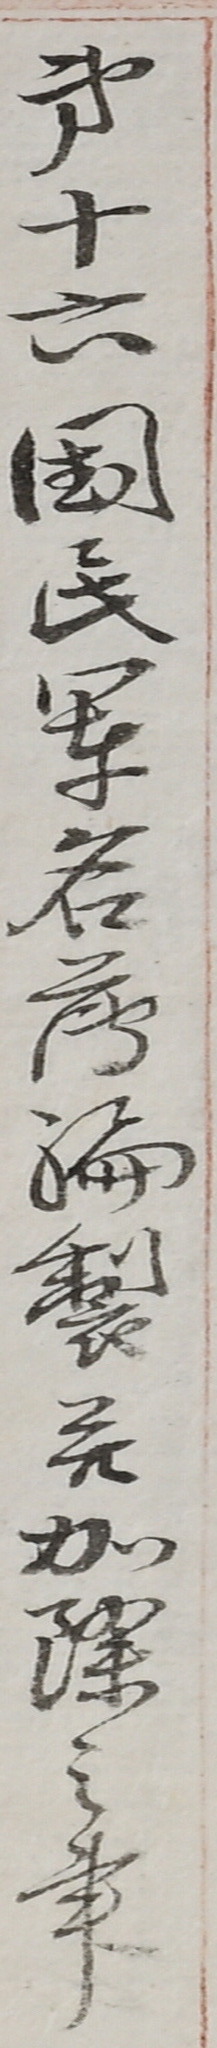第十六国民軍名薄編製并加除之事
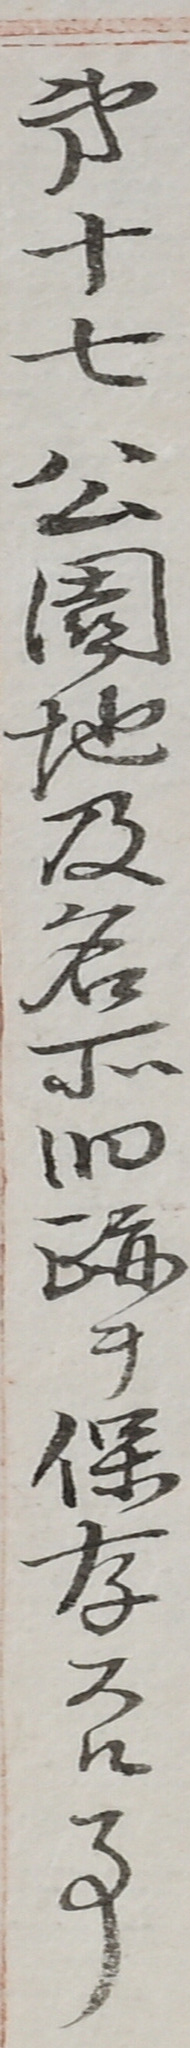第十七公園地及名所旧跡ヲ保存スル事
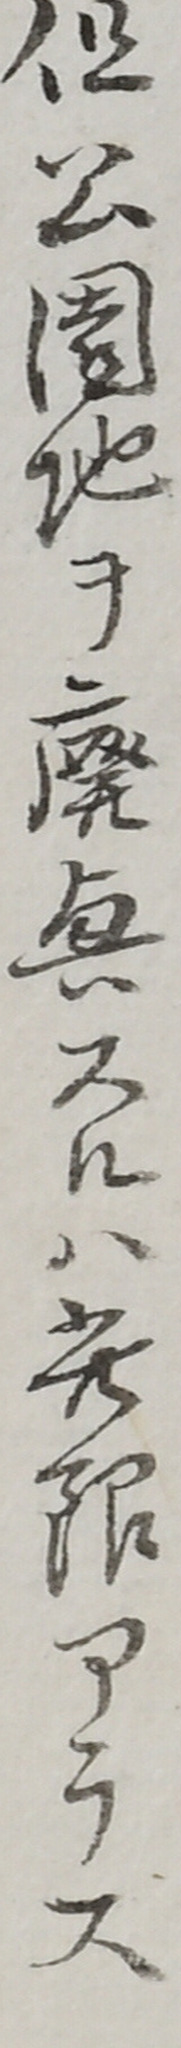但公園地ヲ廃与スルハ開限アラス
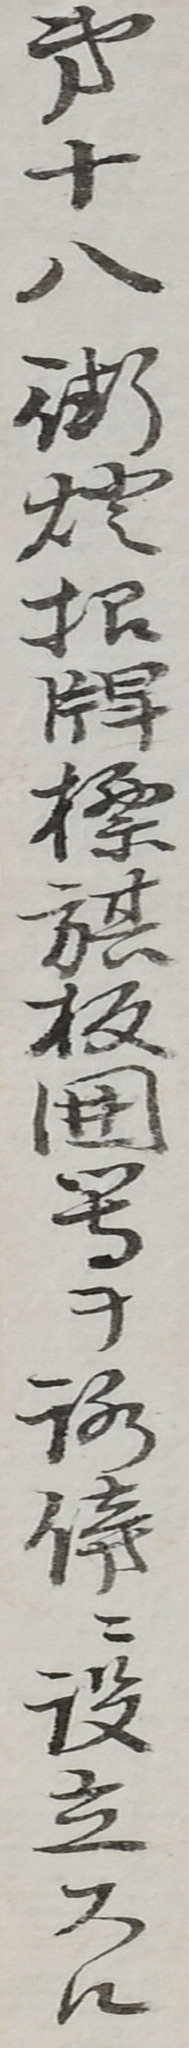第十八街燈招牌標旗板囲等ヲ路傍ニ設立スル
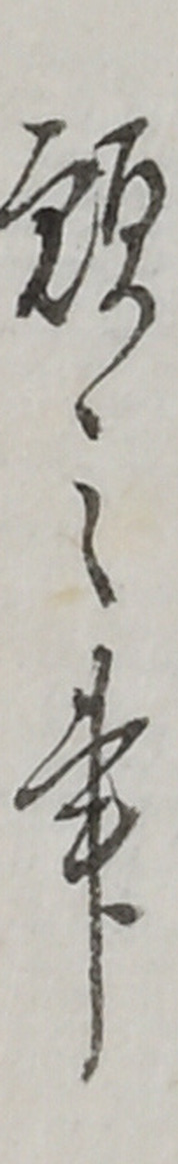願之事
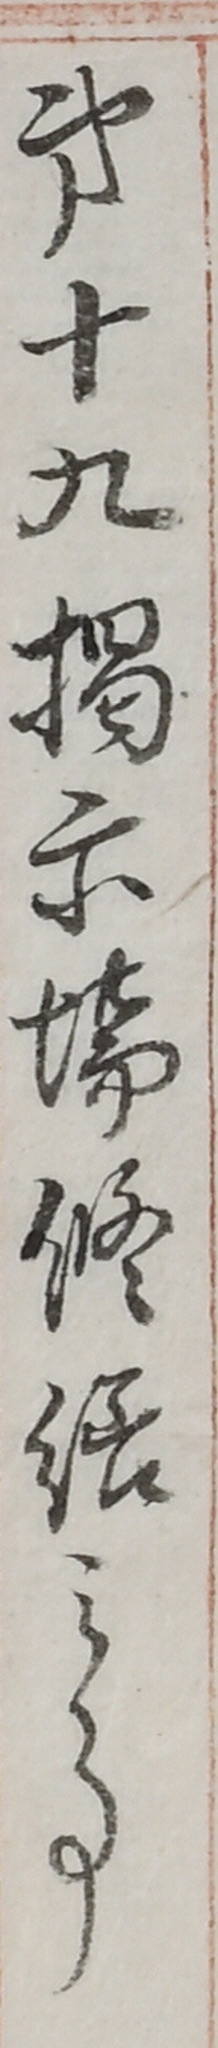第十九掲示場修繕之事
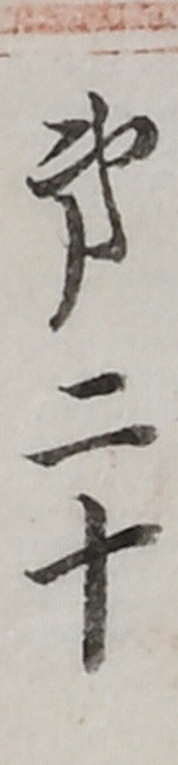第二十

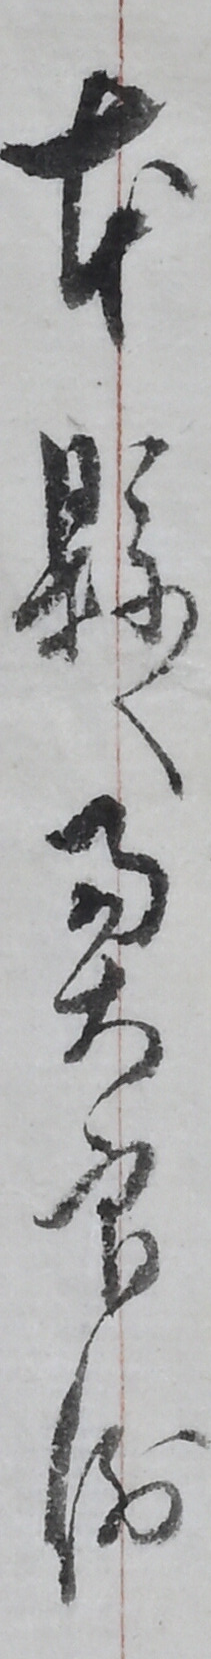本県へ奥印例
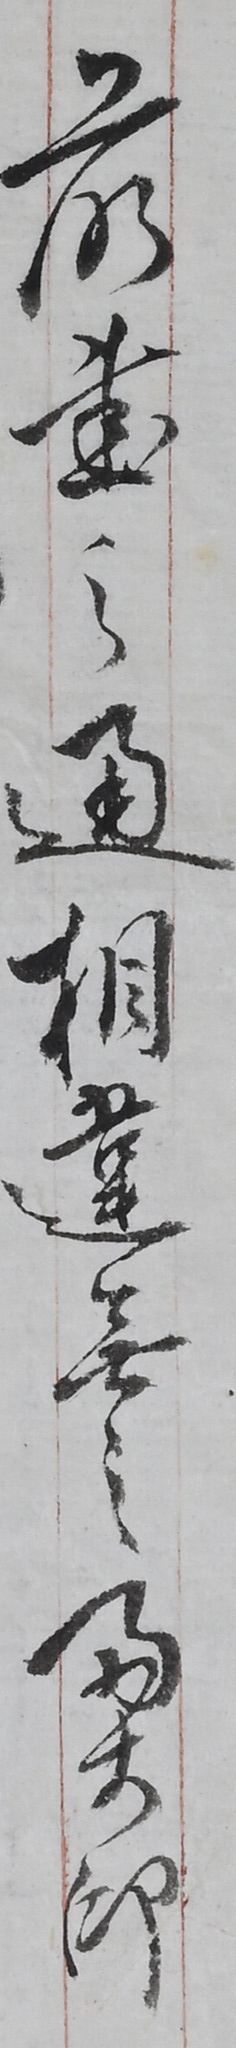前書之通相違無之多如何
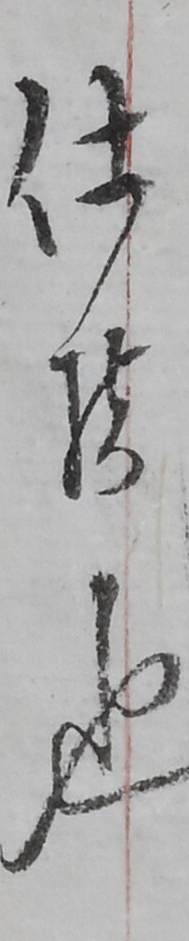仕候也
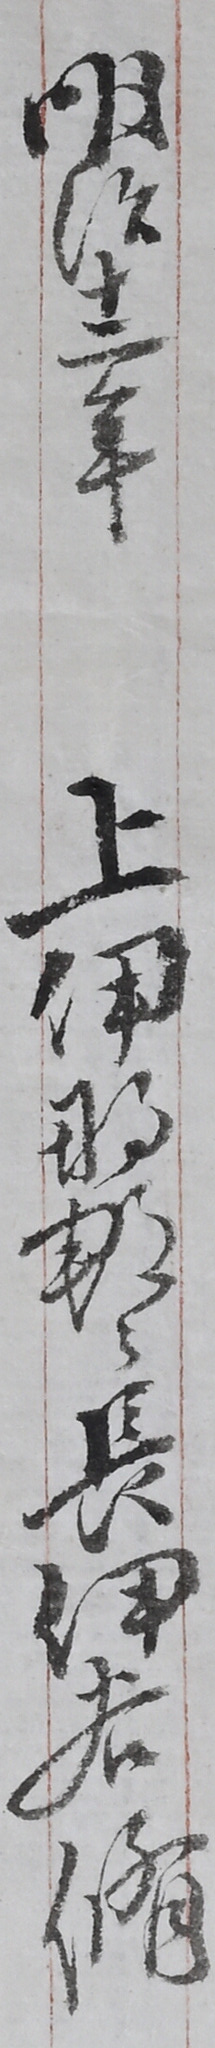明治十二年上伊那郡々長伊谷修
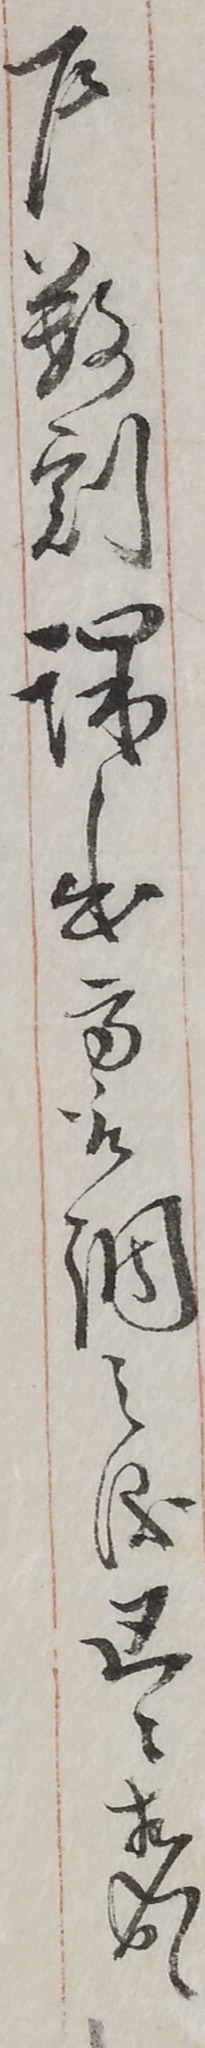戸数割調申出方取調之儀又々相成候
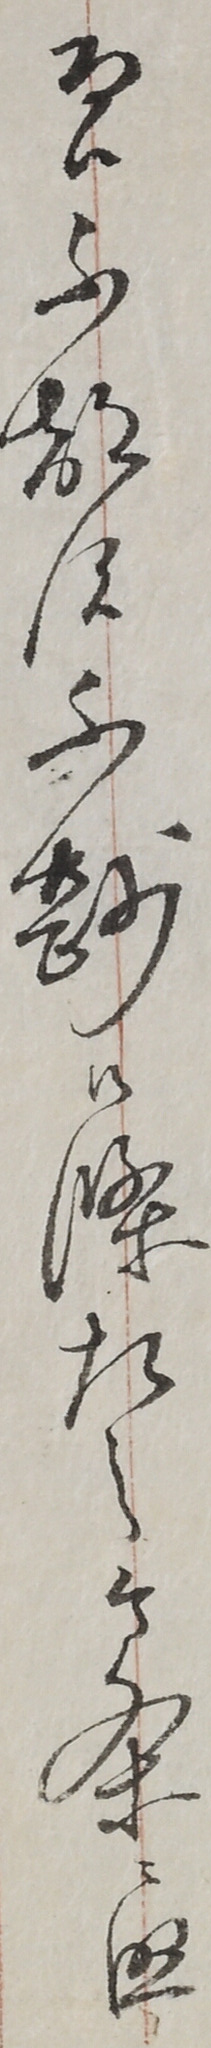而は不都沢不尠候條左之ケ条ニ思
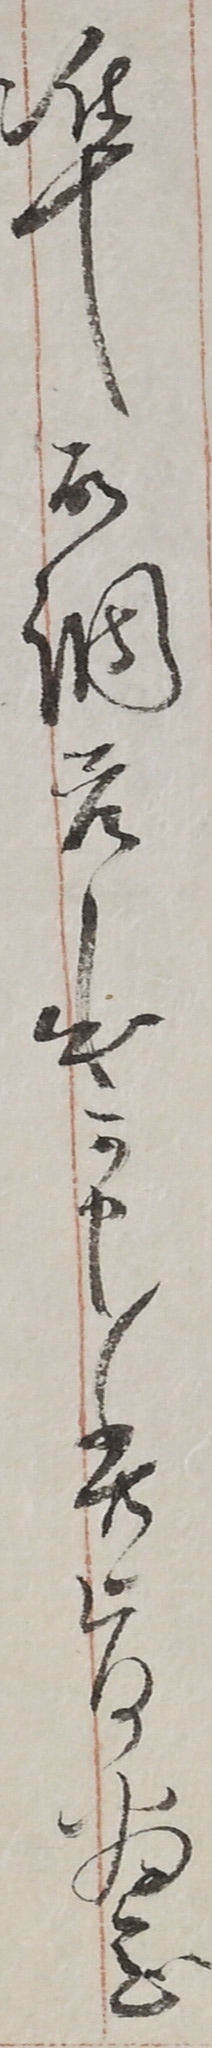準に取調差出可申候旨持念
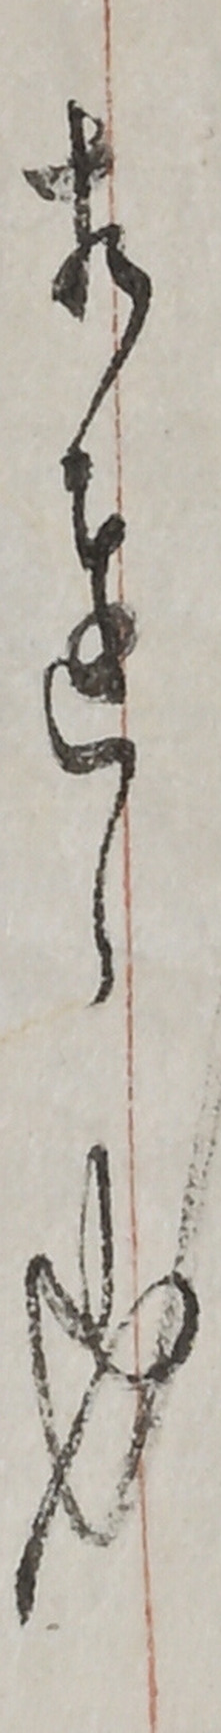相達候哉
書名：郡役所勤務中御用抜書
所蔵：伊那市立高遠町図書館・合同会社AMANE
